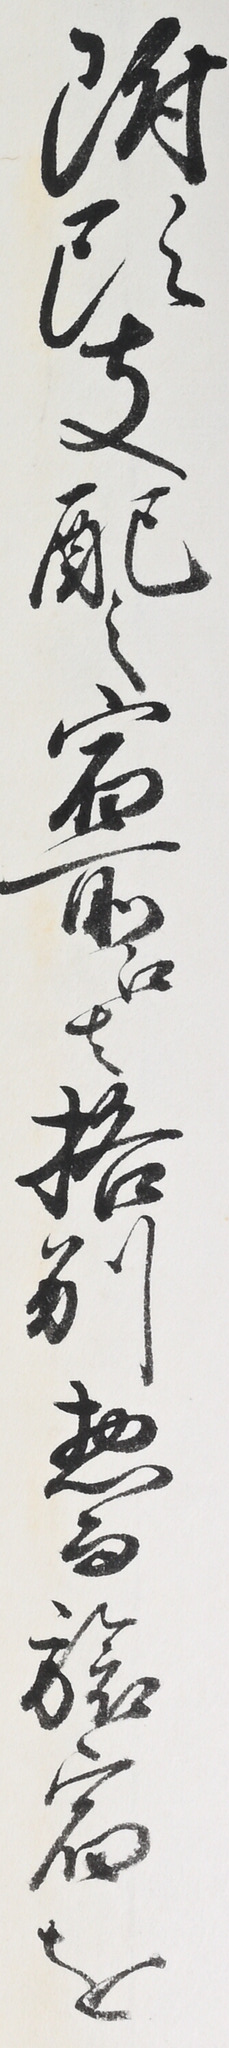附頭支配之宿所え者格別惣而旅宿を
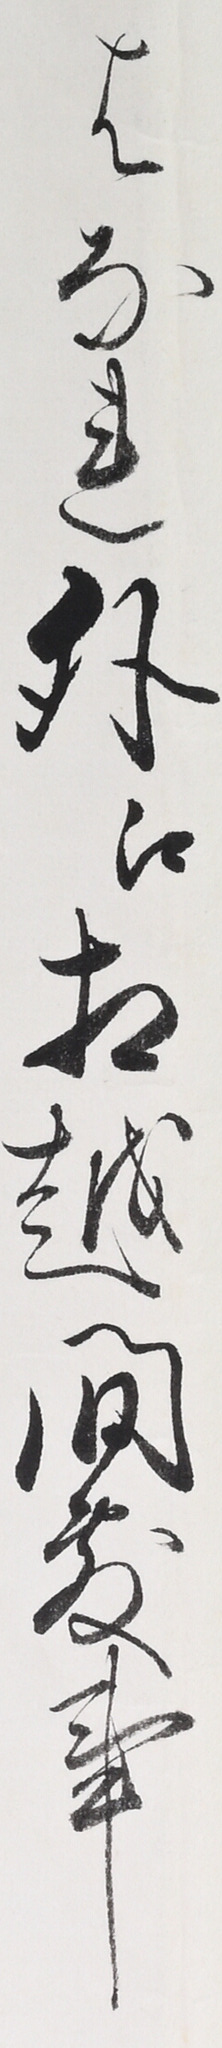はなれ外え相越間敷事
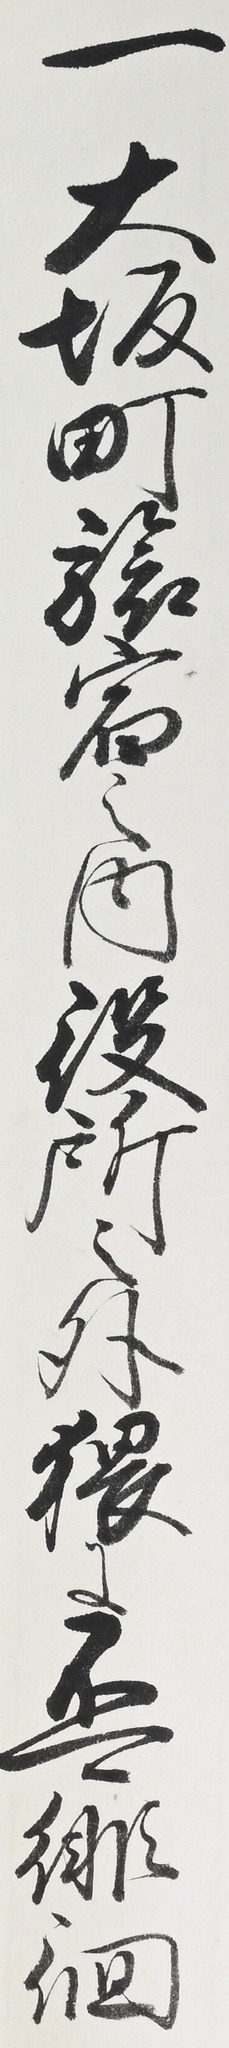一大坂町旅宿之内役所之外猥に不可徘徊
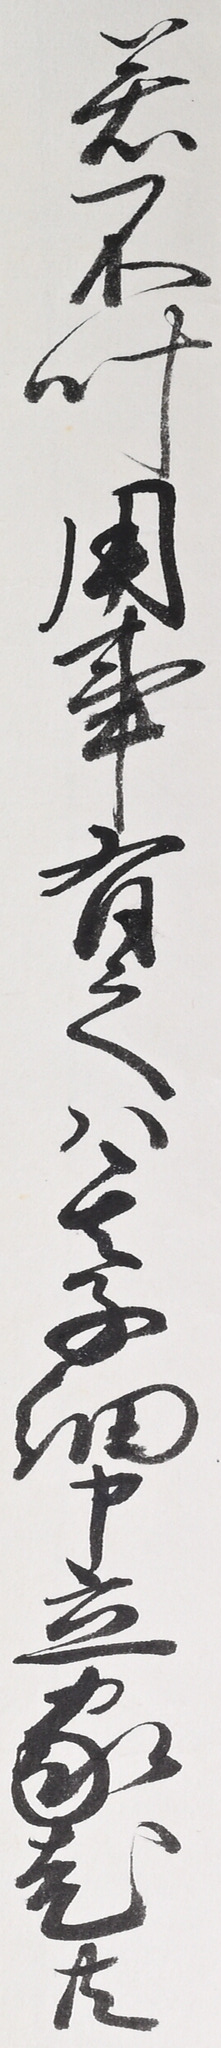若不叶用事有之ハ其子細申立家老共
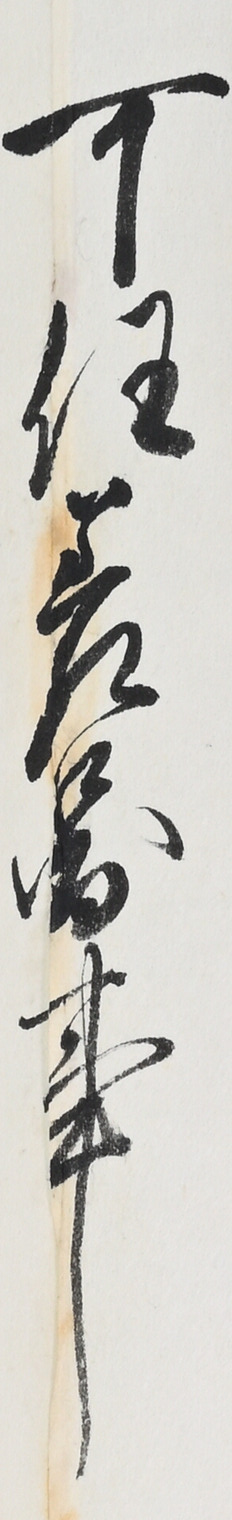可任差図事
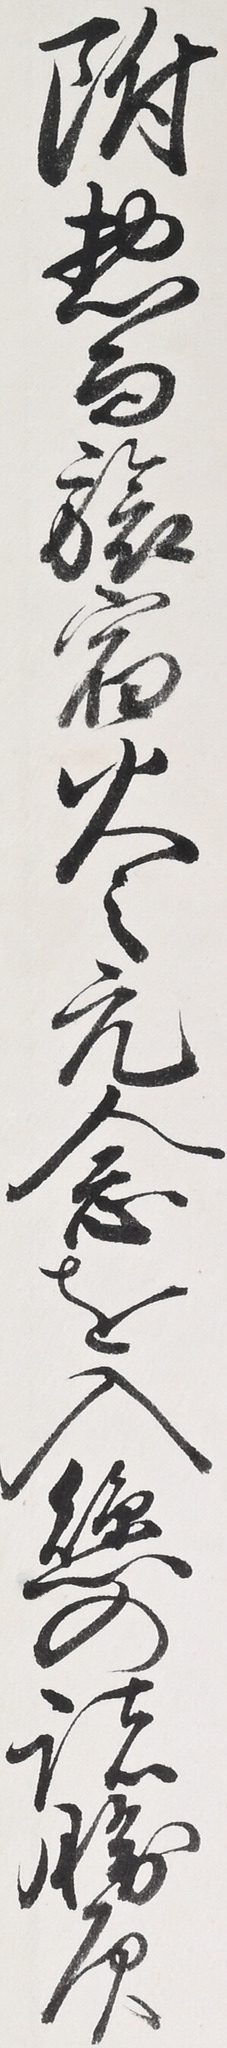附惣而旅宿火之元念を入懸の諸勝負
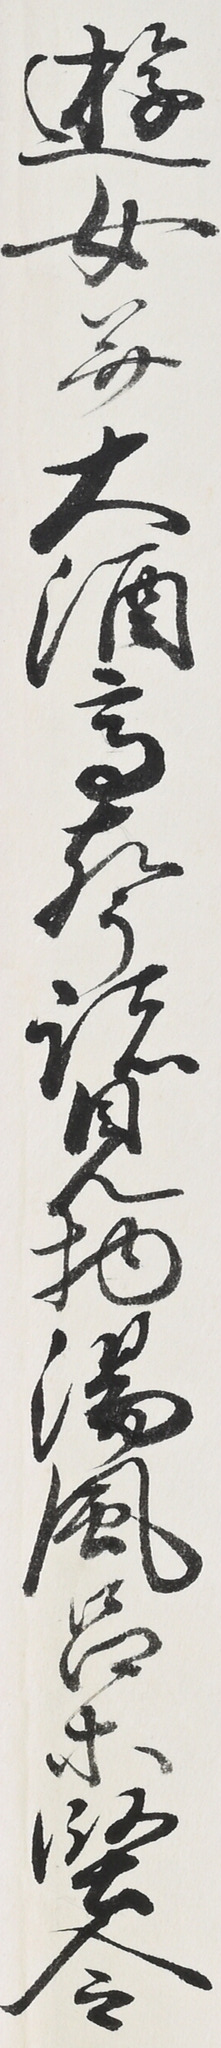遊女幷大酒高声諸見物湯風呂等堅令
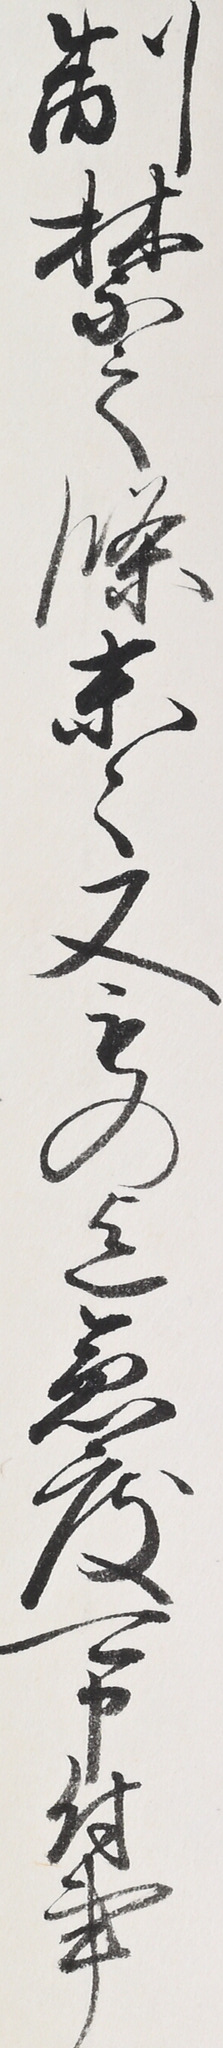制禁之條末々又もの迄急度可申付事
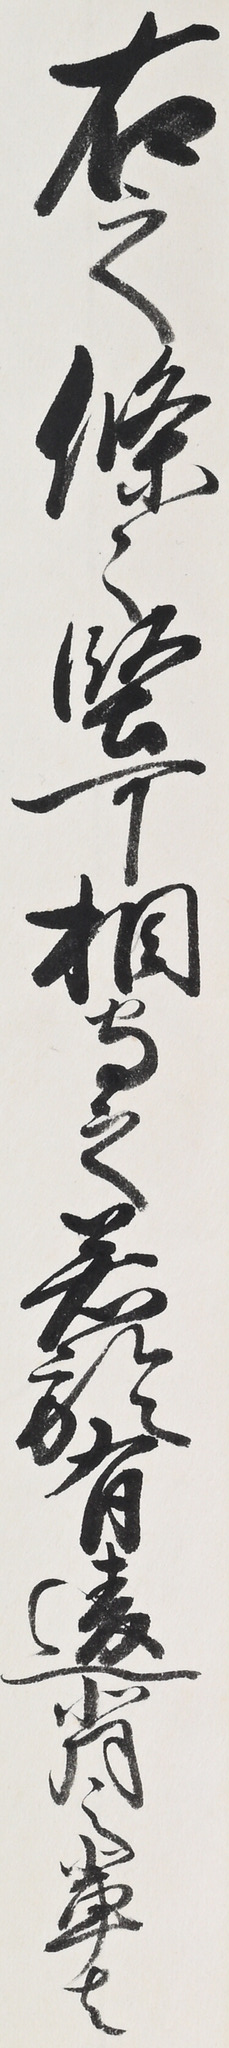右之條々堅可相守之若於有違背之輩者
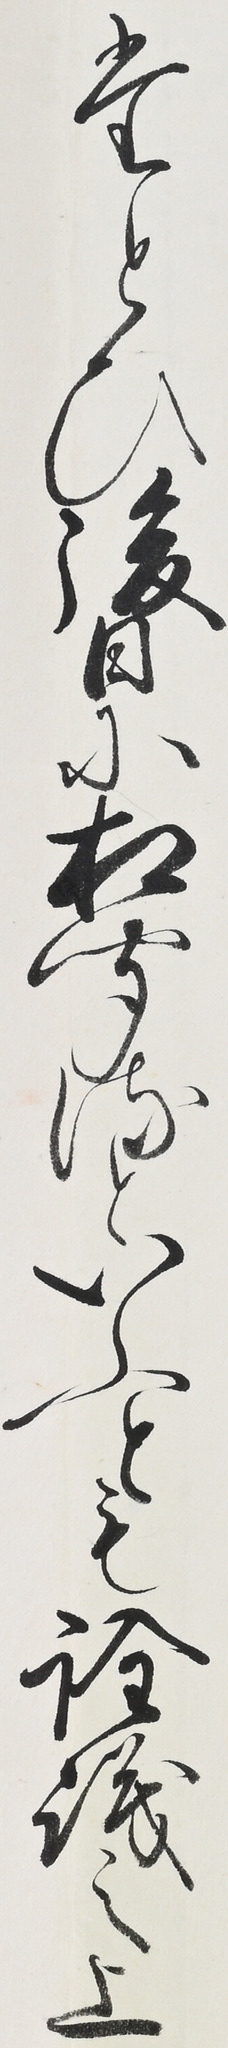たとひ後日に相聞るといふとも詮議之上
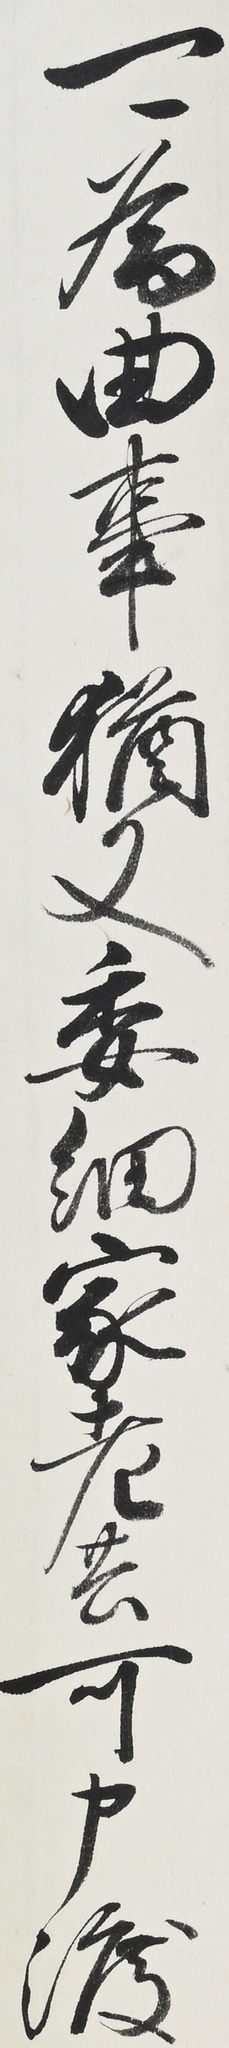可為曲事猶又委細家老共可申渡

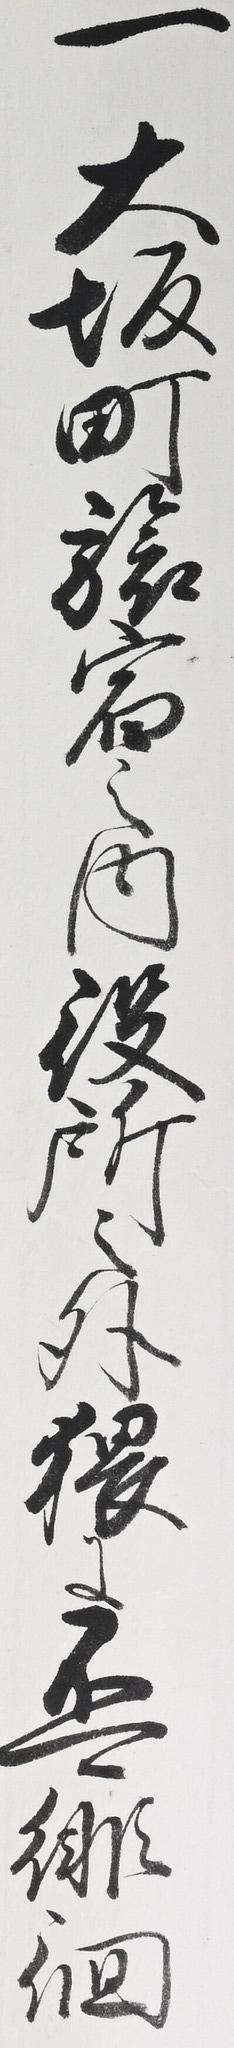一大坂町旅宿之門役所之外猥に不可徘徊
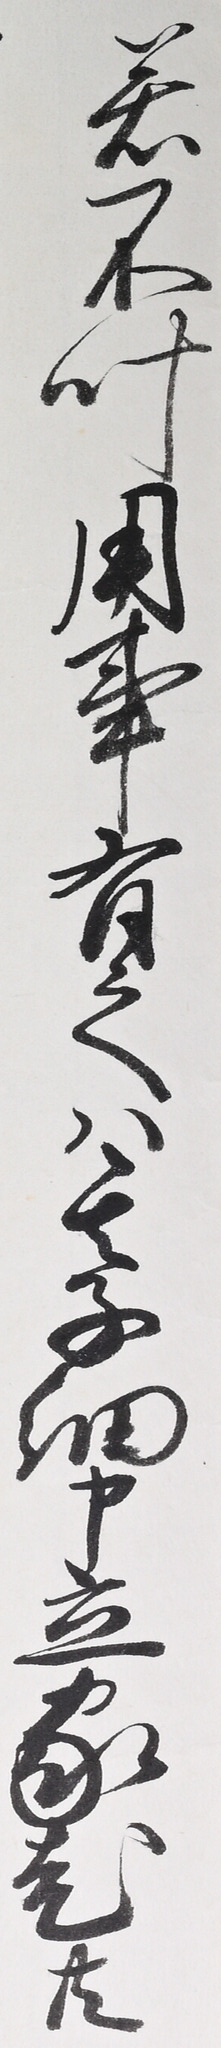若不叶用事有之ハ其子細申立家老共
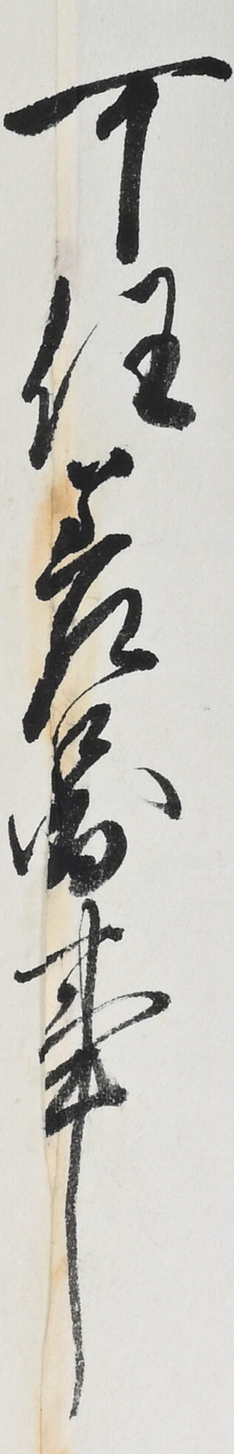可任差図事
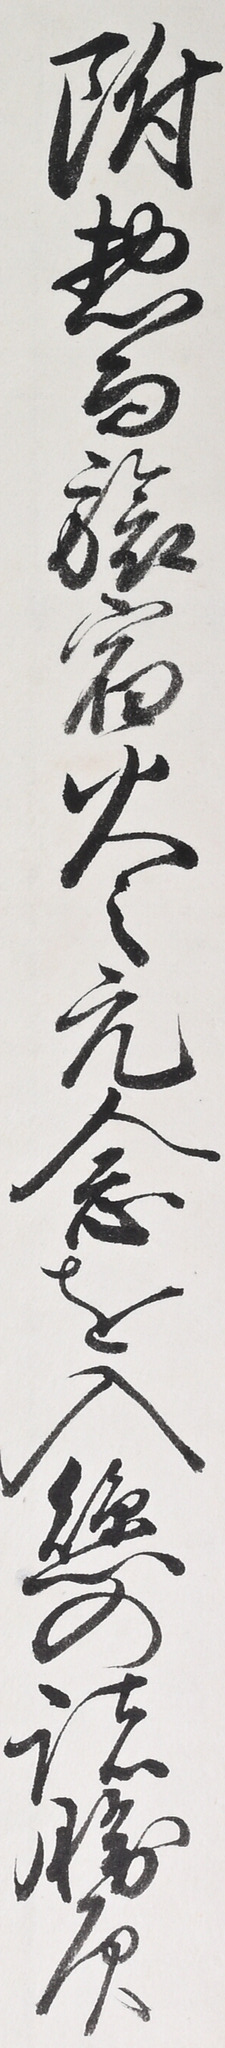附惣而旅宿火之元念を入懸の諸勝負
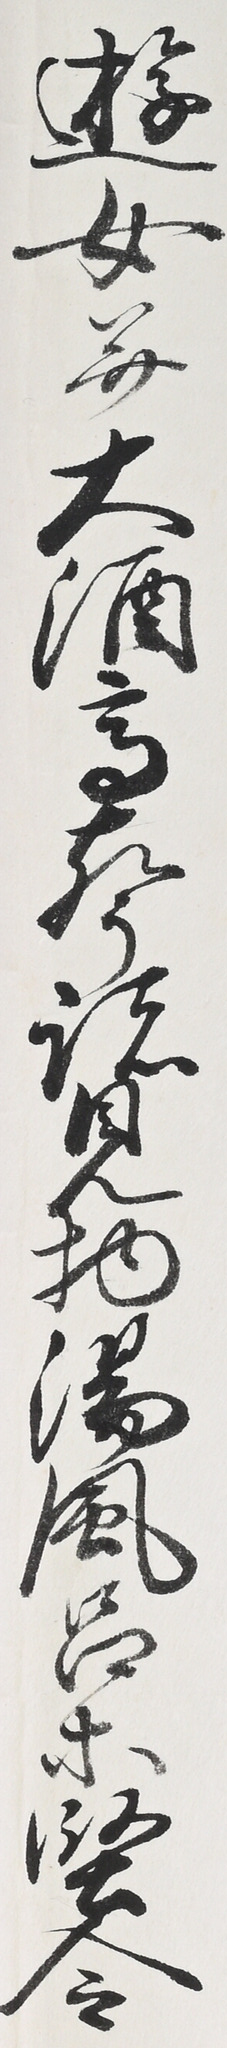遊女幷大酒高声諸見物湯風呂等堅令
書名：大阪道中法度
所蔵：伊那市立高遠町図書館・合同会社AMANE
